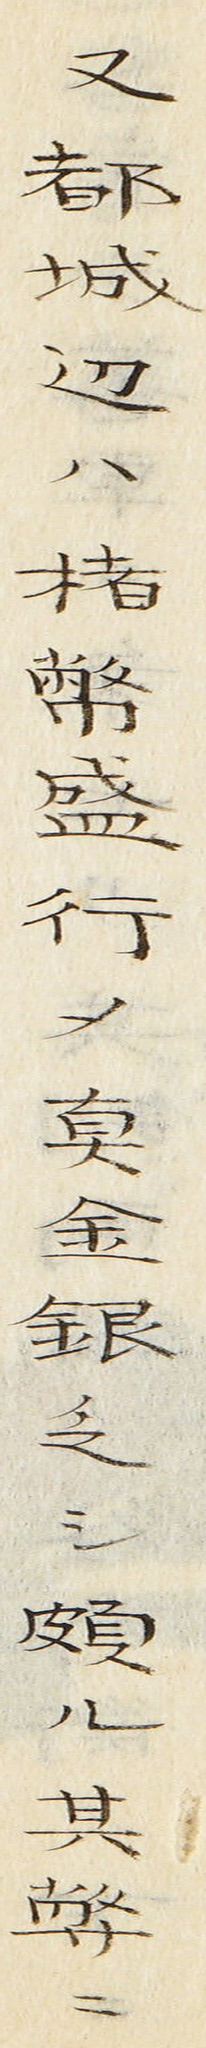又都城辺ハ楮幣盛行シテ真金銀乏シ頗ル其弊ニ
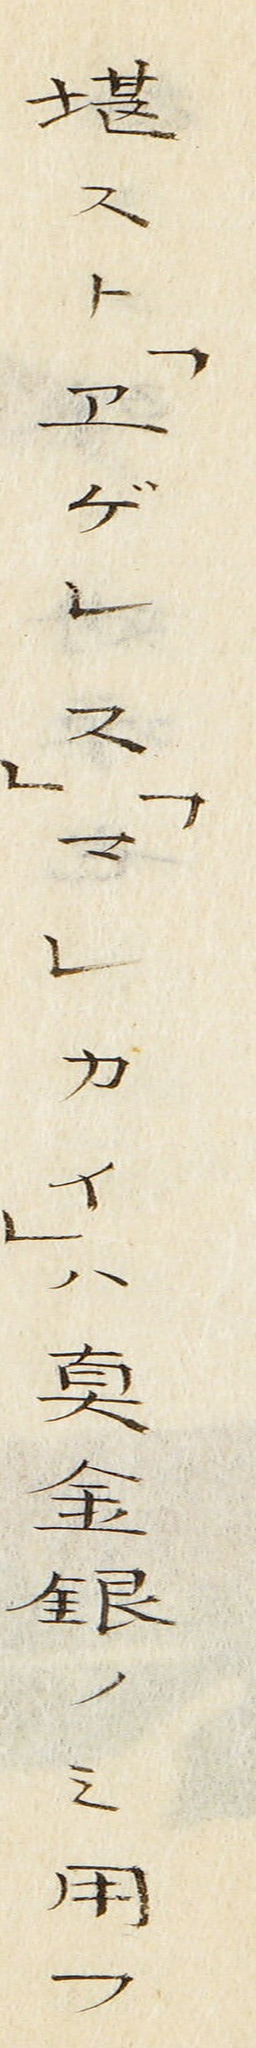堪スト「ヱゲレス」「マレカイ」ハ真金銀ノミ用フ
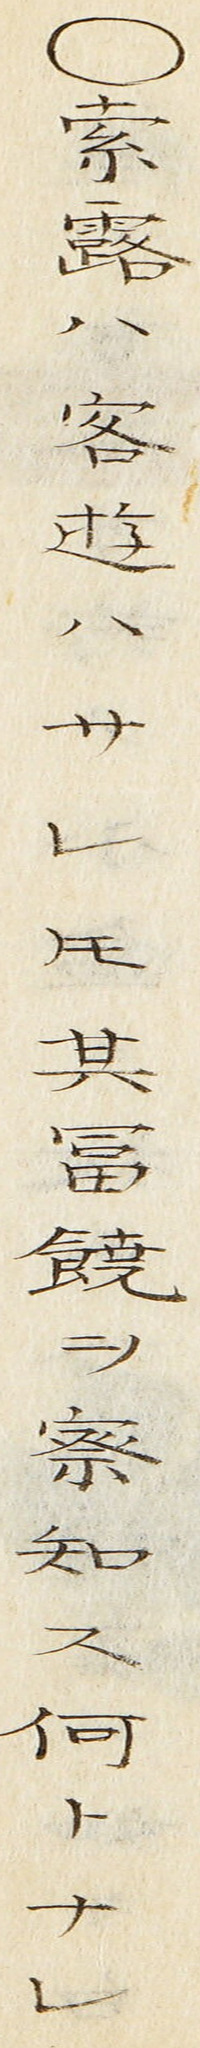〇索露ハ客遊ハサレトモ其冨饒ヲ察知ス何トナレ
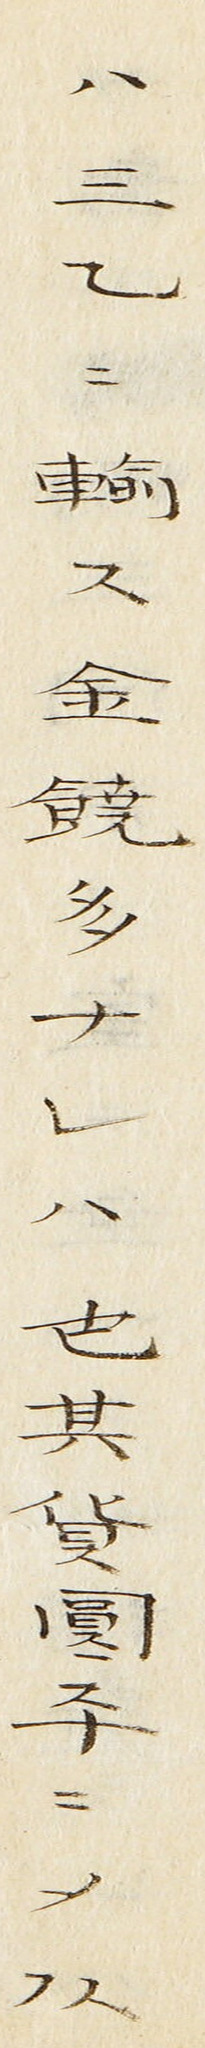ハ三乙ニ輸ス金饒多ナレハ也其貨円平ニシテ
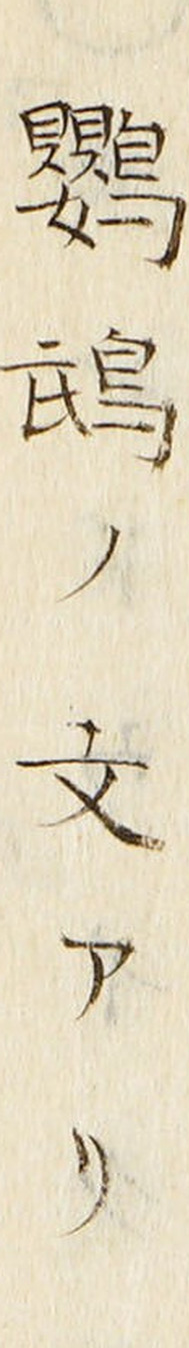鸚鵡ノ文アリ
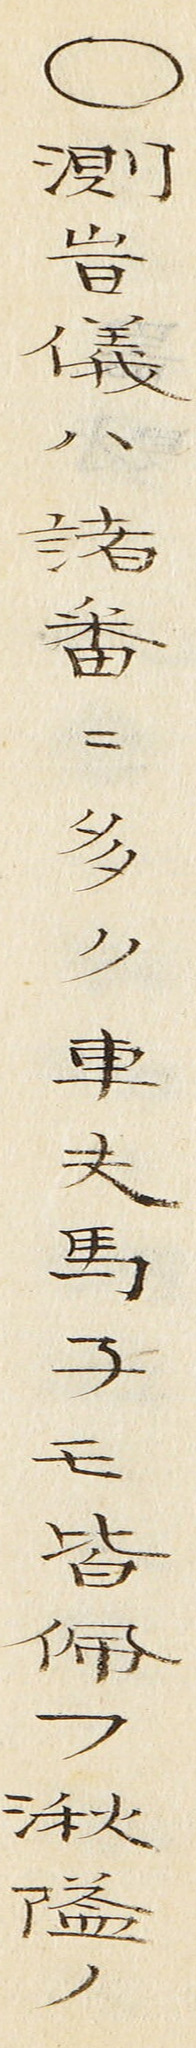〇測旹儀ハ諸番ニ多ク車夫馬子モ皆佩フ湫隘ノ
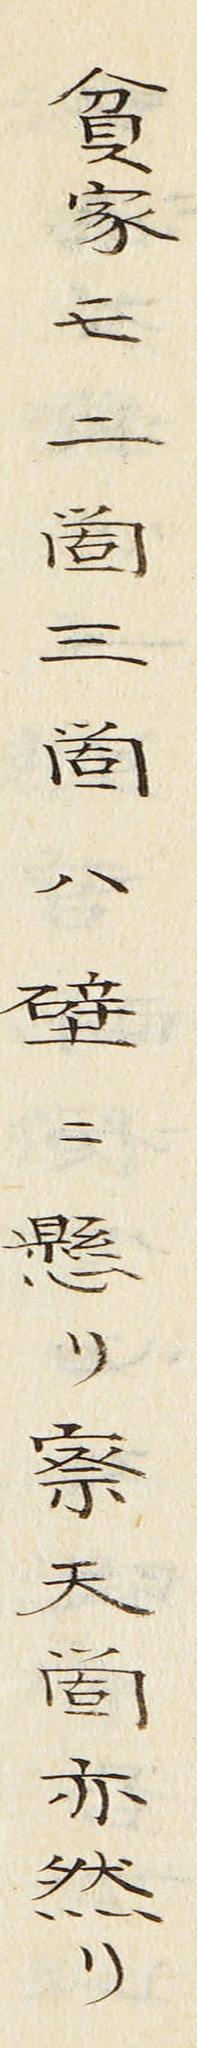貧家モ二箇三箇ハ壁ニ懸リ察天箇亦然リ
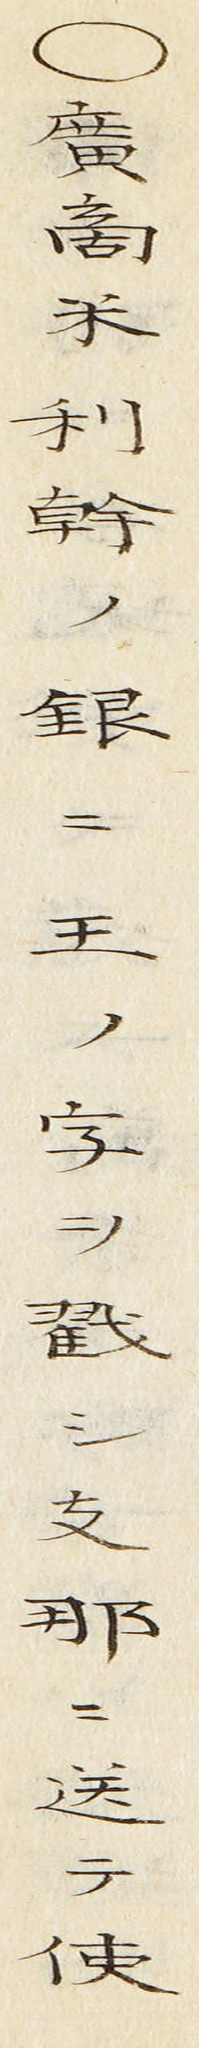〇広商米利幹ノ銀ニ王ノ字ヲ戳シ支ニ送テ使
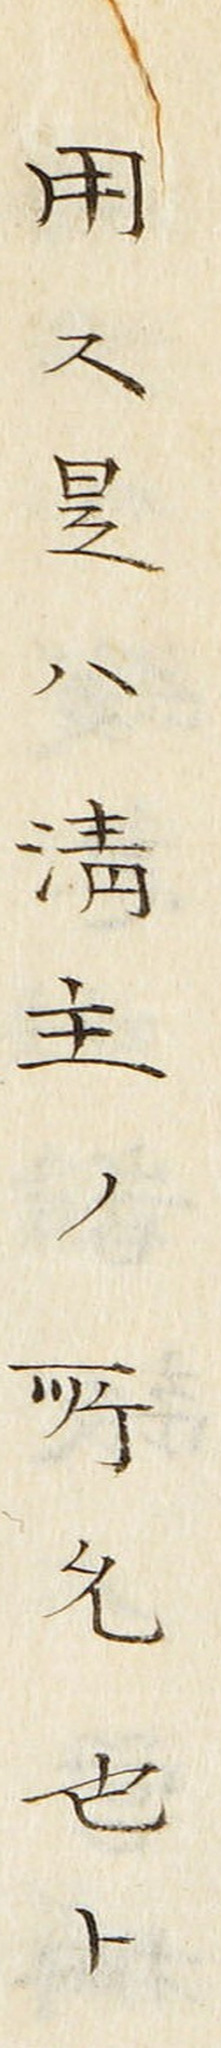用ス是ハ清主ノ所乞？也ト
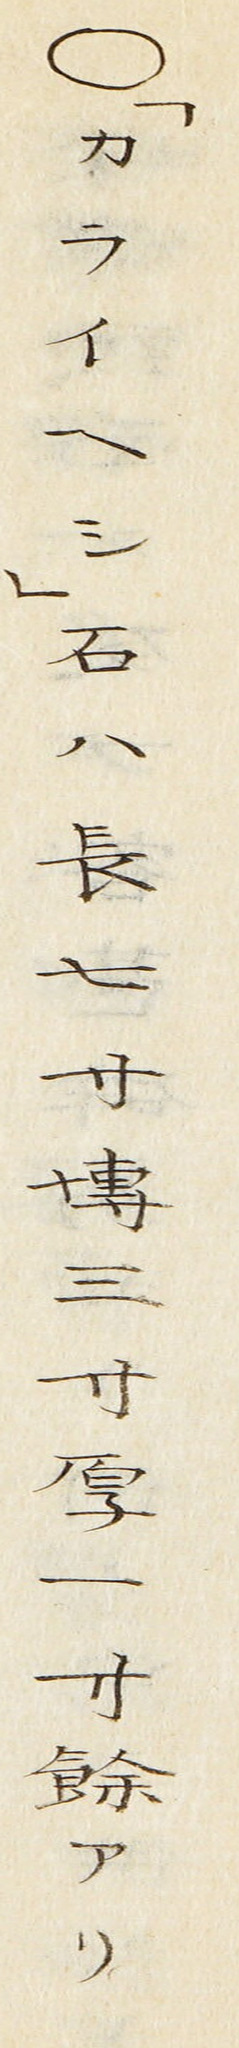〇「カライヘシ」石ハ長七寸博三寸厚一寸余アリ
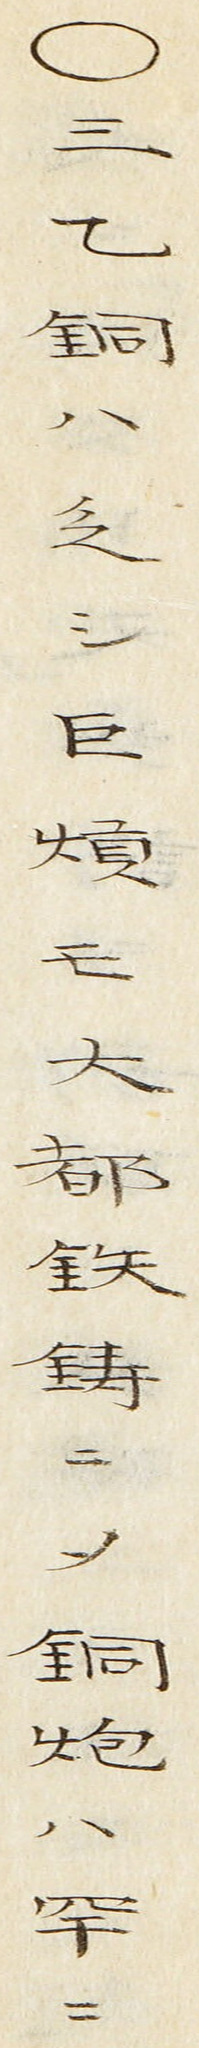〇三乙銅ハ乏シ巨熕モ大都鉄鋳ニシテ銅炮ハ罕ニ
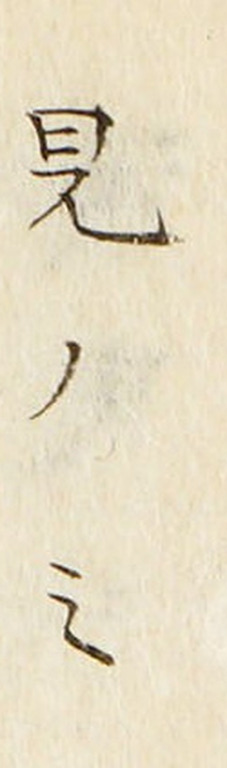見ノミ
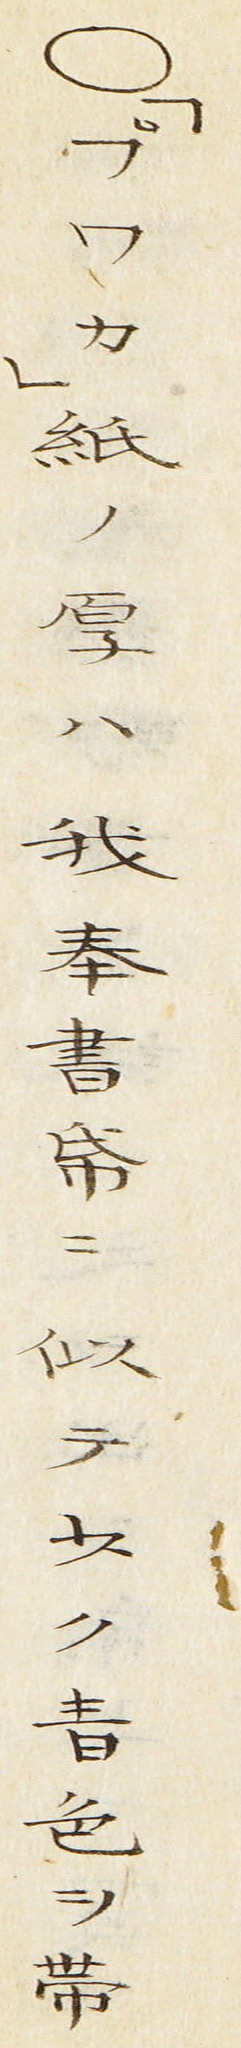〇「プワカ」紙ノ厚ハ我奉書帋ニ似テ少ク青色ヲ帯
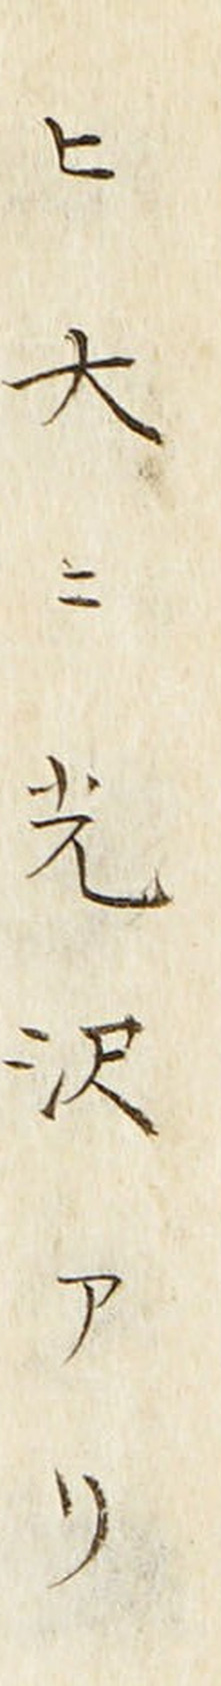ヒ大ニ光沢アリ
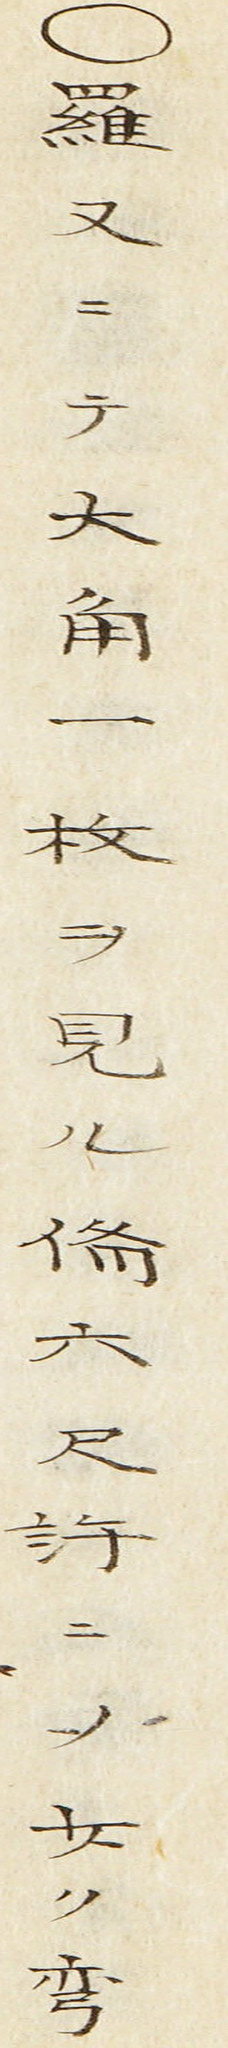〇羅又ニテ大角一枚ヲ見ル修六尺許ニシテ少ク弯
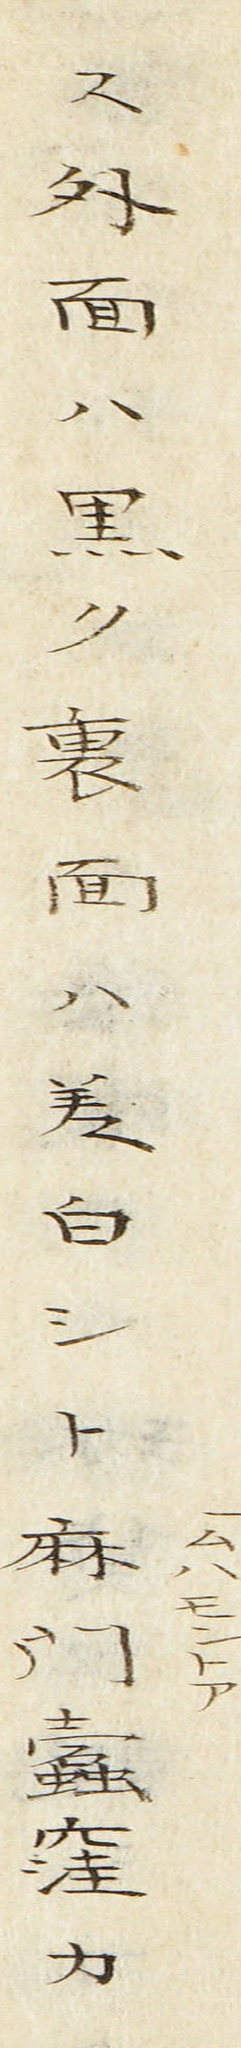ス外面ハ黒ク裏面ハ美？白シト麻門蠧窪カ
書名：蕃談
